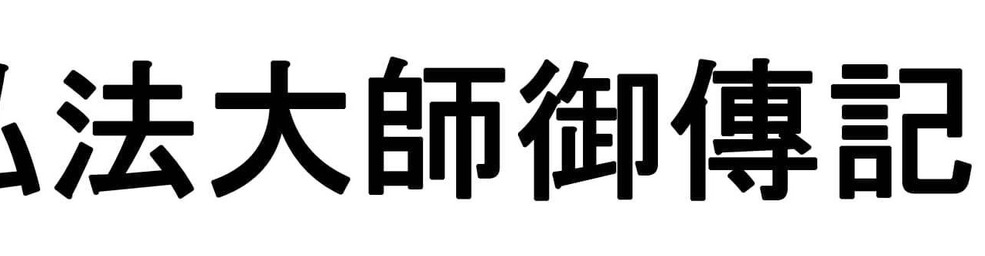弘法大師御伝記
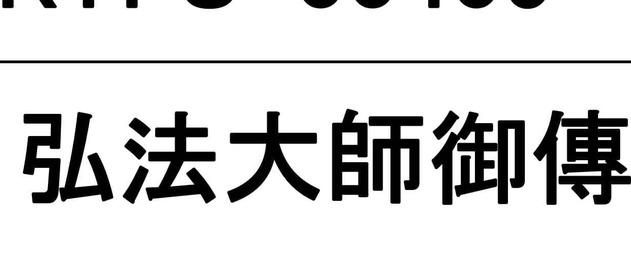弘法大師御伝記
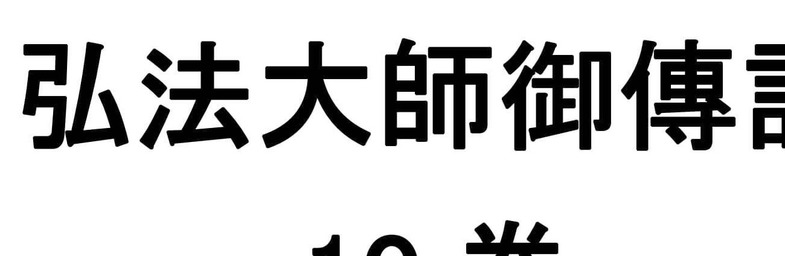弘法大師御伝記
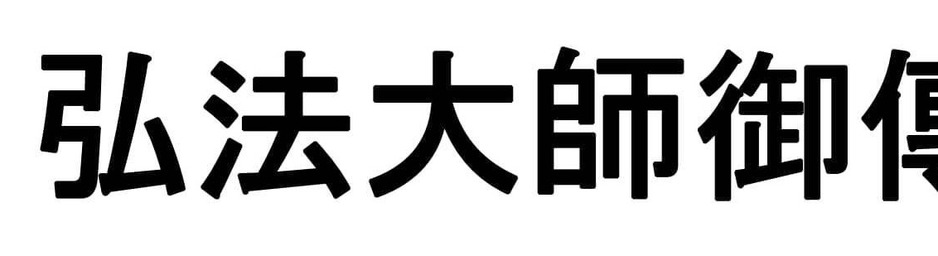弘法大師御伝記

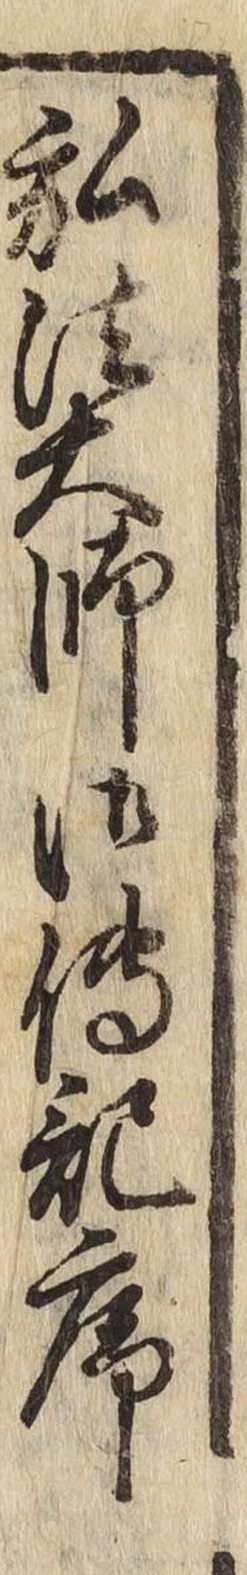弘法大師御伝記序
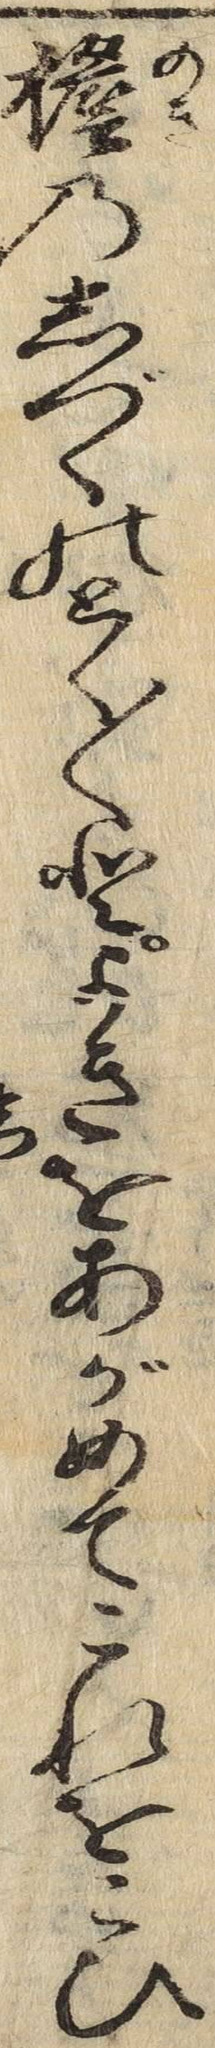檐のしづくのとく〳〵と。よきをあがめてこれをこひ
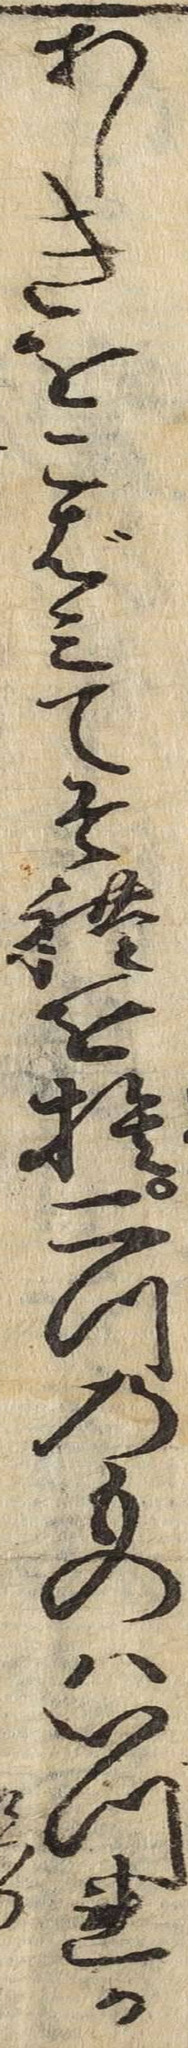あしきをこばみてそれを捨。二つのものはいづれか
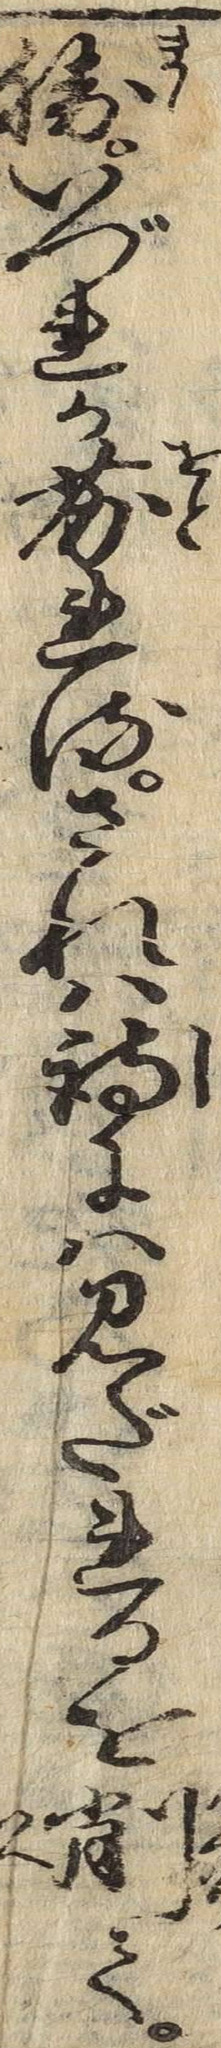勝。いづれか劣れる。されは詩にはみだれるを削て。
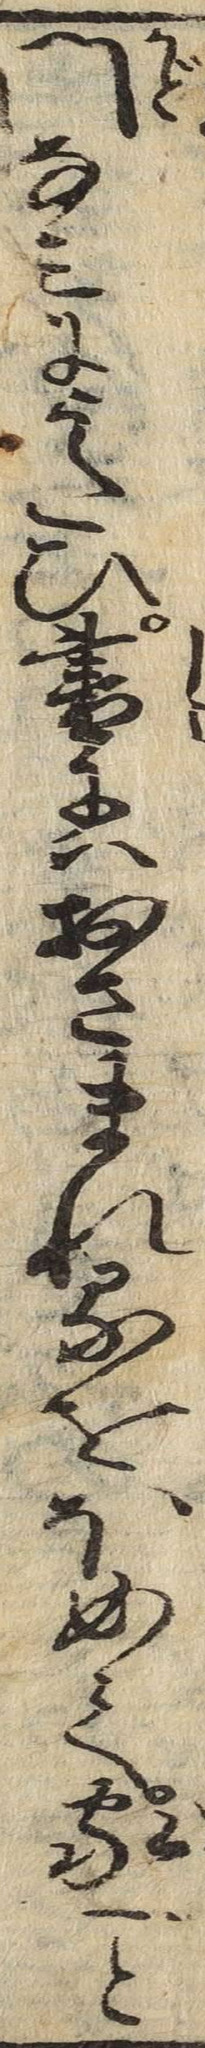門なみにうたひ。書にはおさまれるをほめて。家ごと
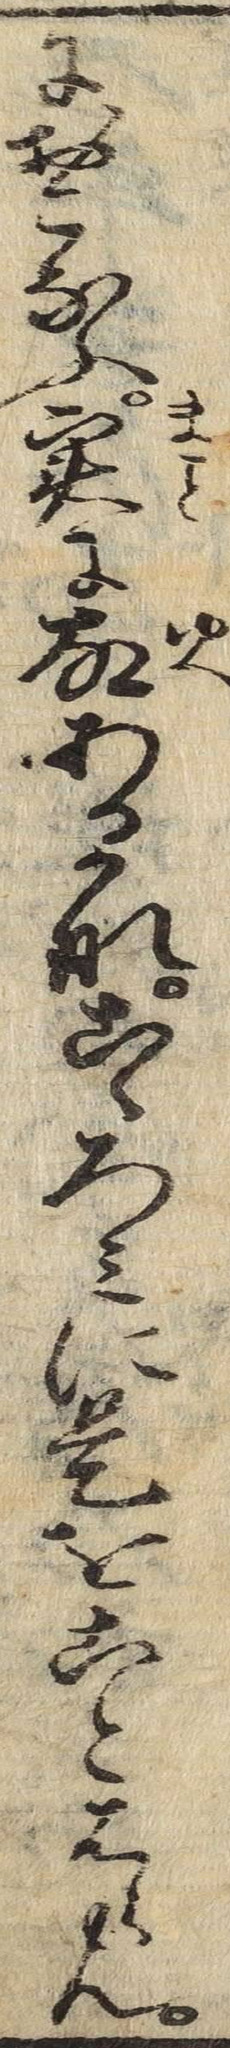におこなふ。実に故あるかな。こゝろみに是をことはらん。
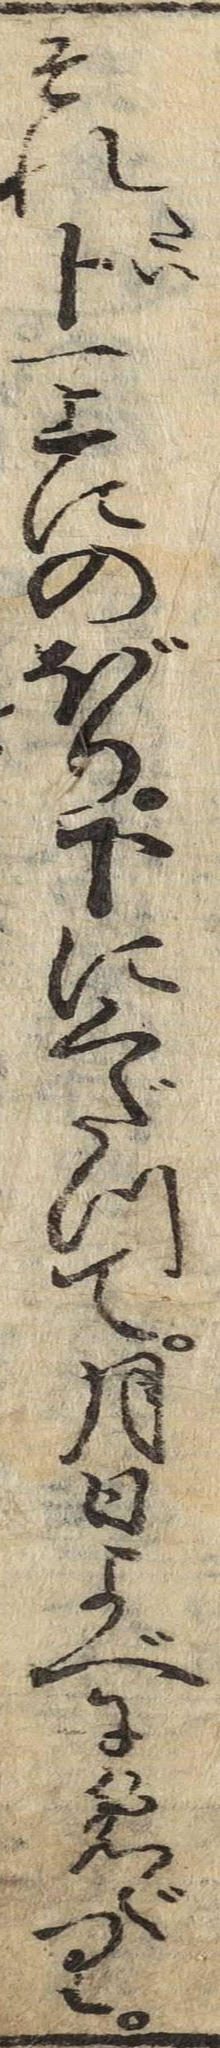それ第一上にのぼり。下にくだつて。月日よべにめぐり。
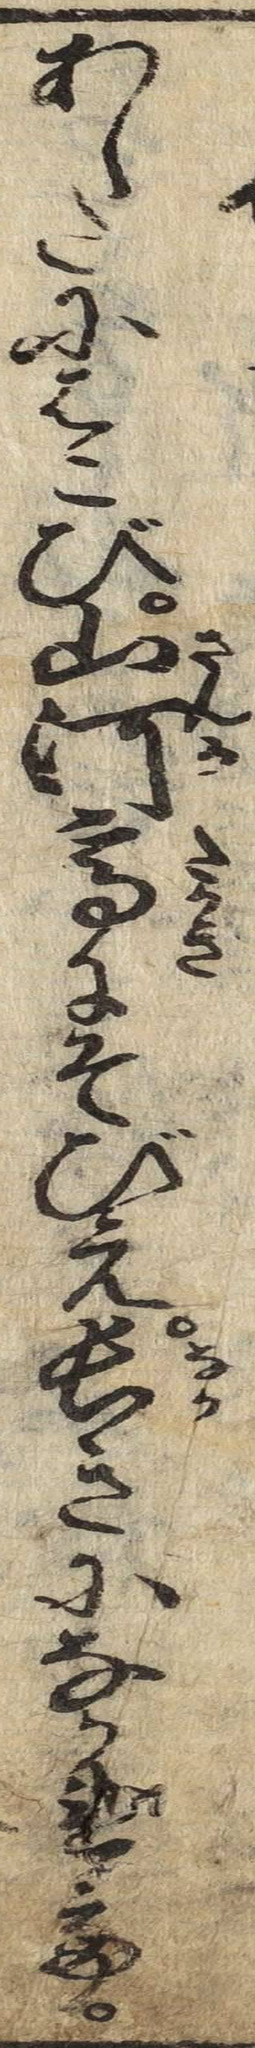あしたにはこび。山河高にそびえ。長きになかれて。
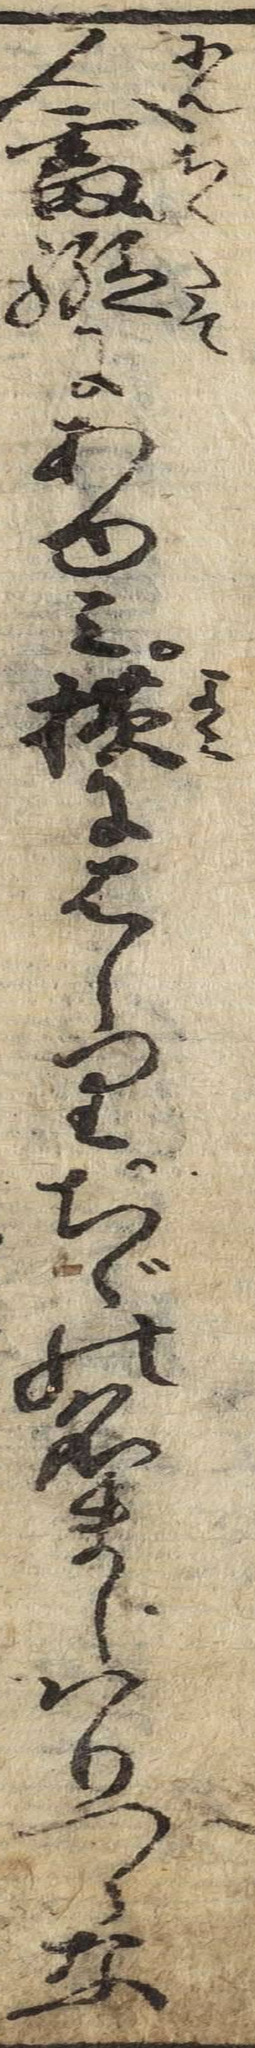人畜縦にあゆみ。横にはしり。ちゞの名まじはりつらな
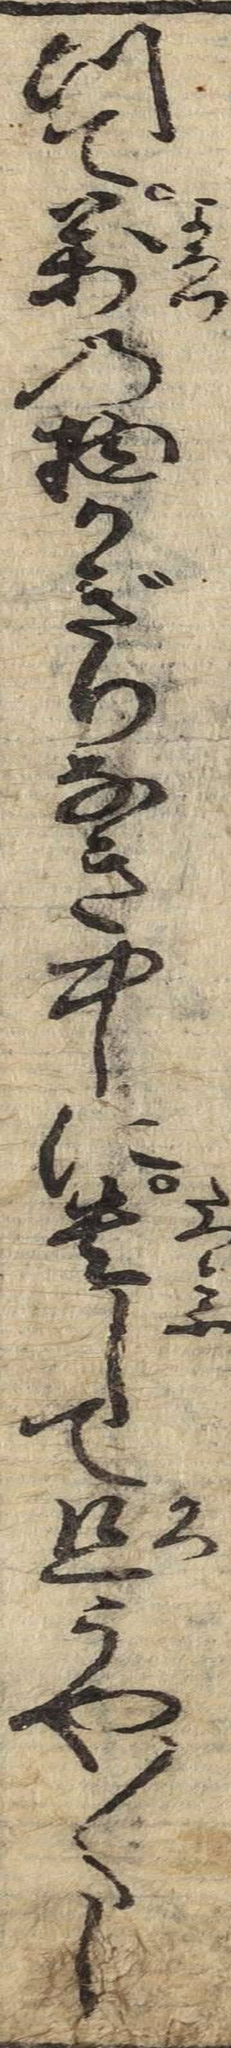つて。万の物かぎりなき中に。貴して且うや〳〵し

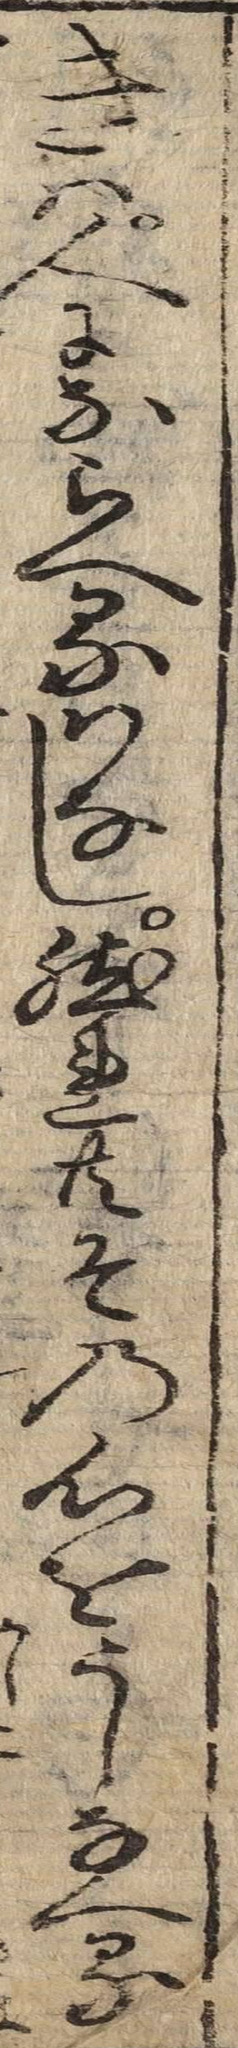きは。人にならへるはなし。然れ共その名をうなへる
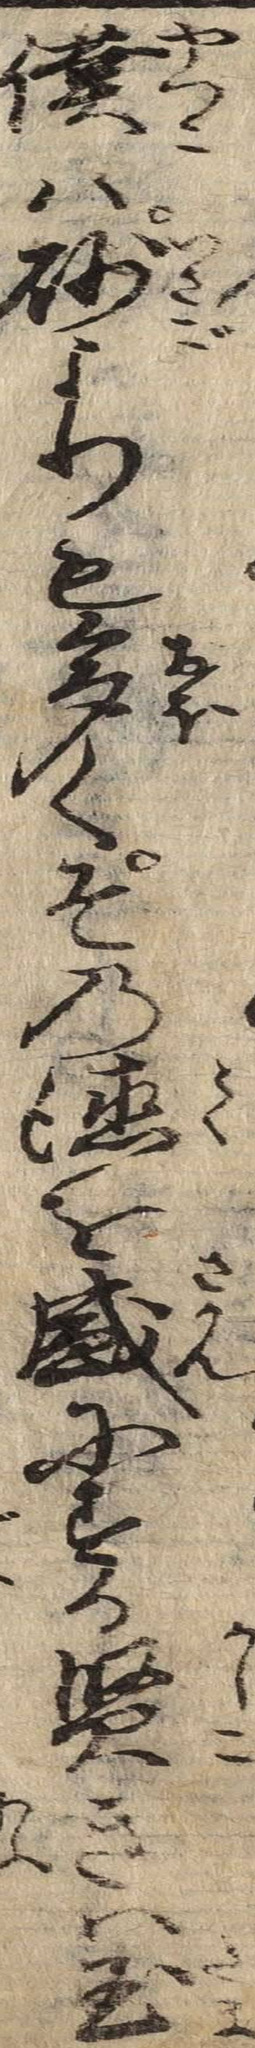僕は。砂よりも多く。その徳を盛にする賢き玉
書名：弘法大師御傳記
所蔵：京都府立京都学・歴彩館 国文学研究資料館
